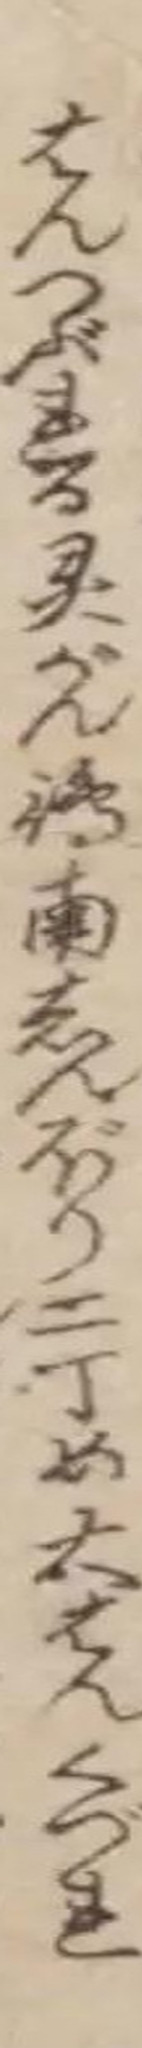はんつぶれる霊がん橋南しんぼり二丁め大はんくづれ
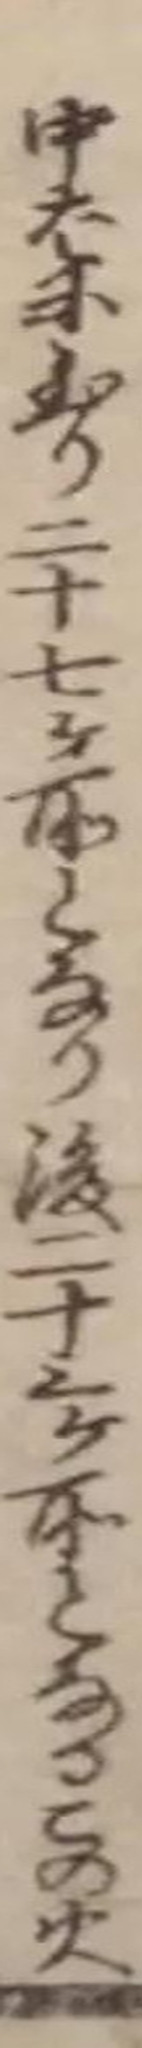中はに至り二十七ヶ所となり後二十三ヶ所となるこの火
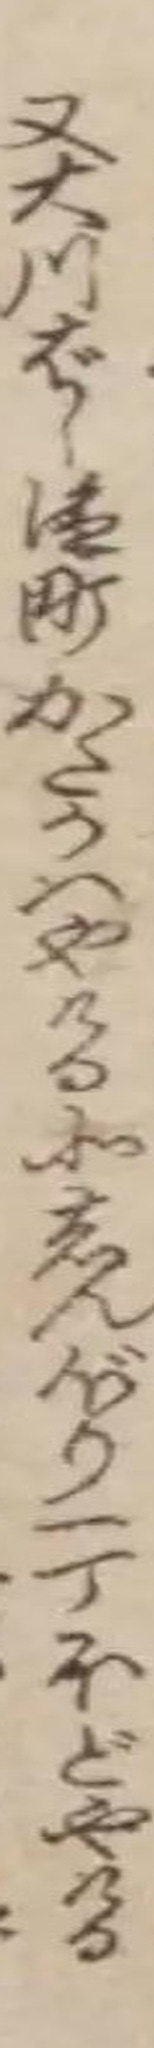又大川ばし湊町かたかはやける北しんぼり一丁ほどやける
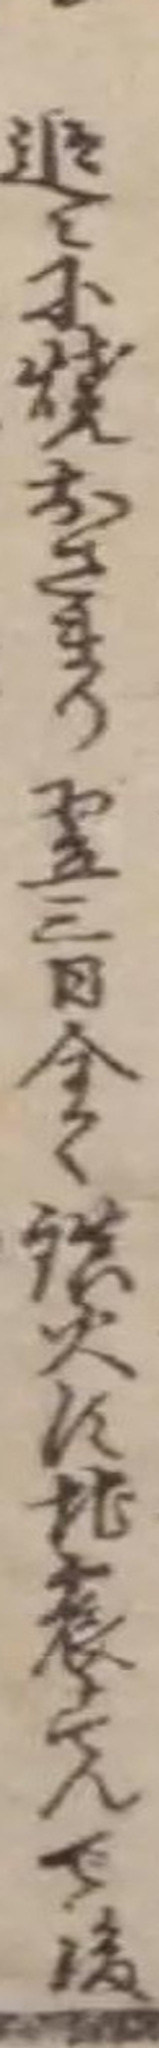追々に焼おさまり翌三日全く鎮火す地震すんで後
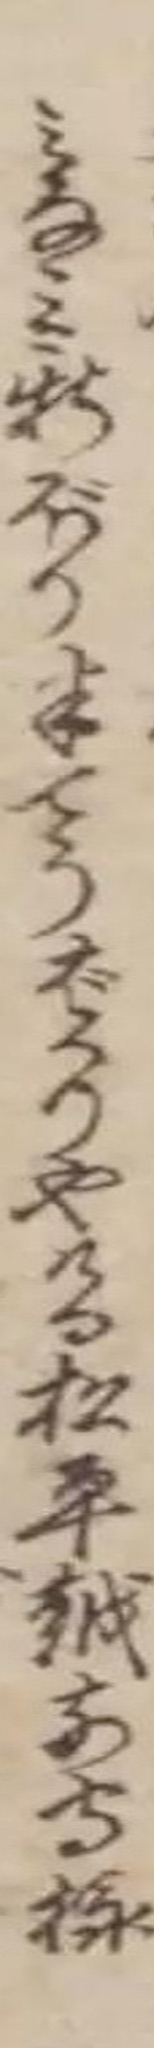みなみ新ぼり半てうばかりやける松平越前守様
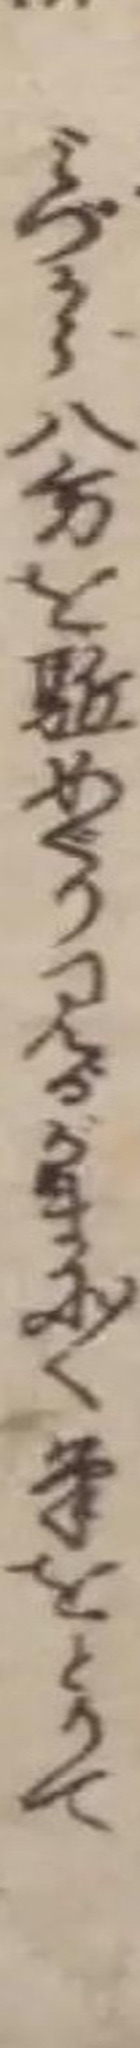みづから八方を駈めぐり見るがまに〳〵筆をとりて
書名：関東大地震末代鑑
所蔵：国立国会図書館 National Diet Library, JAPAN
